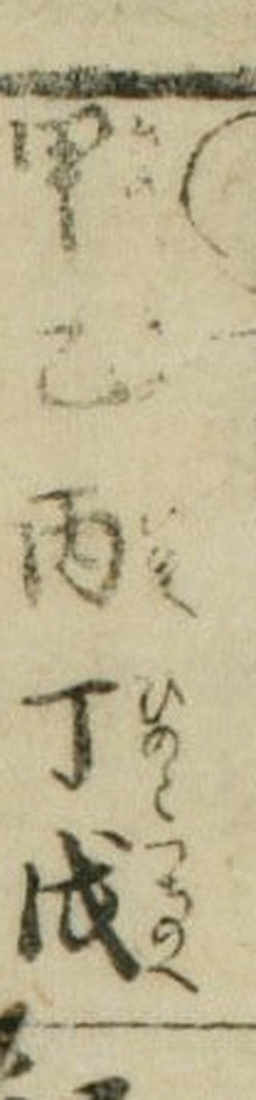甲乙丙丁戊
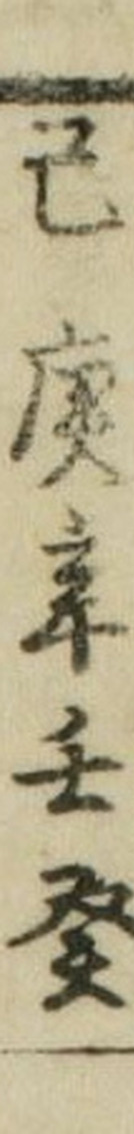己庚辛壬癸
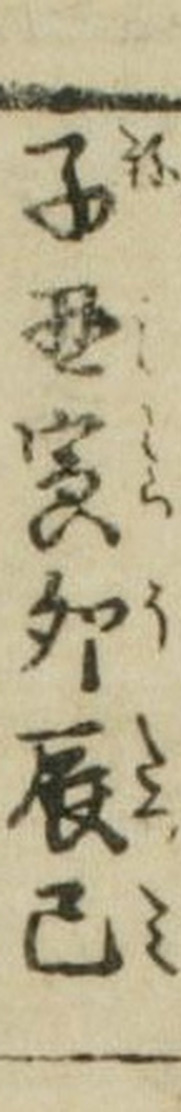子丑寅卯辰巳
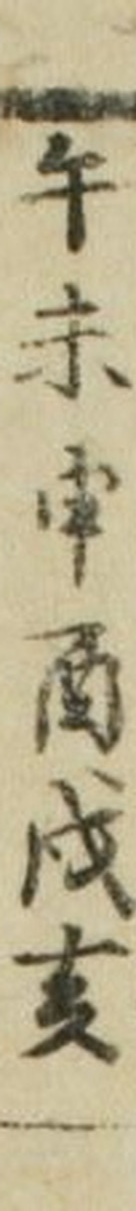午未申酉戌亥
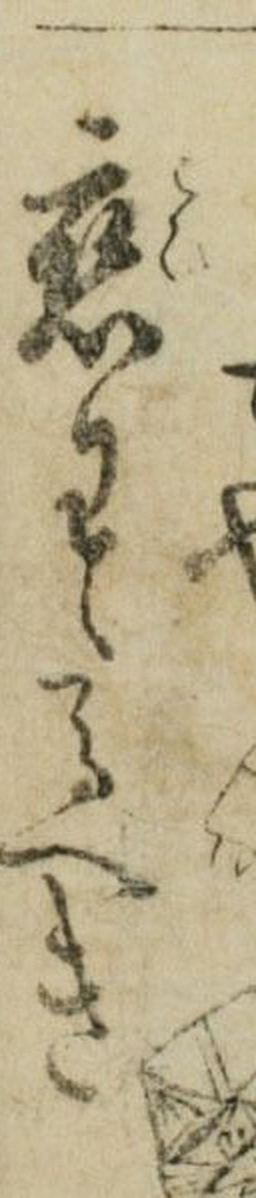恋わたるへき
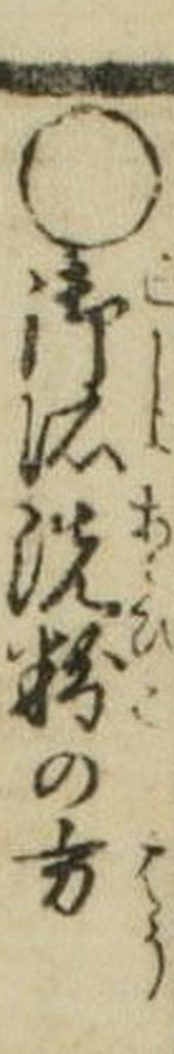○御所洗粉の方
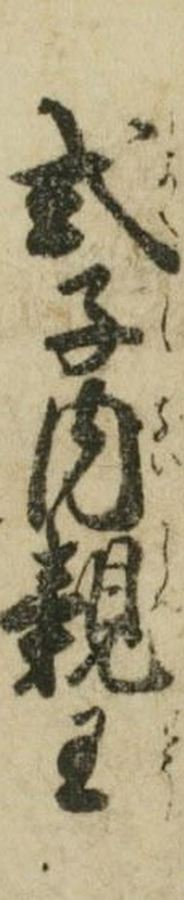式子内親王
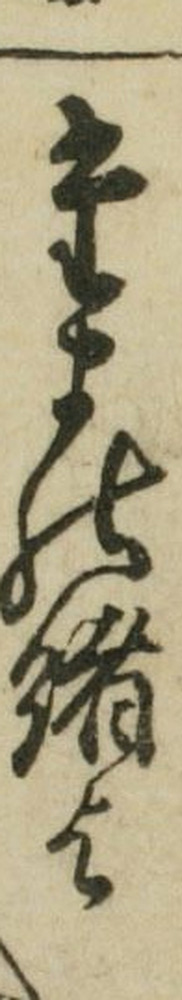たまの緒よ
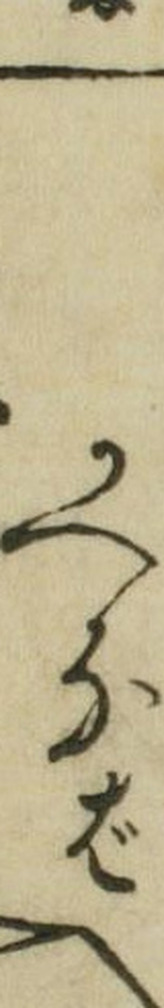かへなば
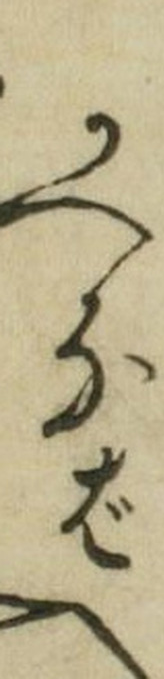かへなば
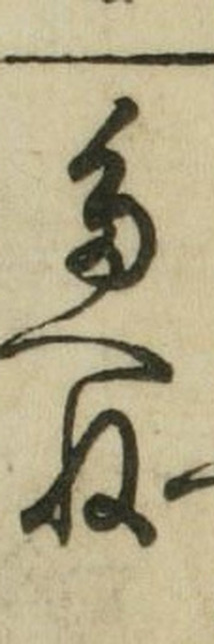たへね
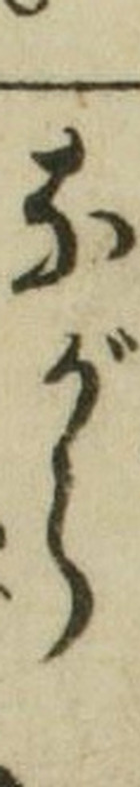ながら
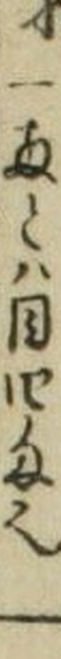一両とは目四匁也
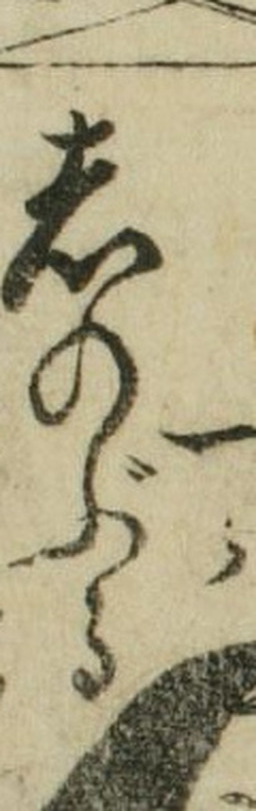しのぶる
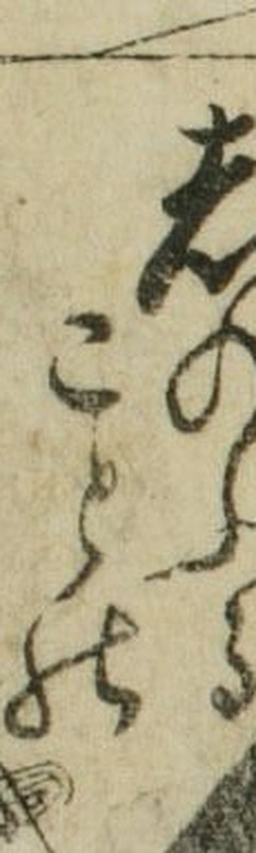ことの
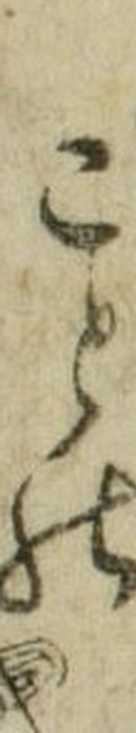ことの
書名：百人一首
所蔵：東京学芸大学教育コンテンツアーカイブ
